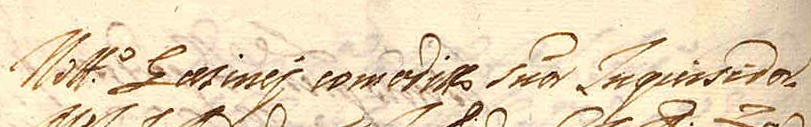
Nott.o E asinej com o ditto snōr Inquisidor.
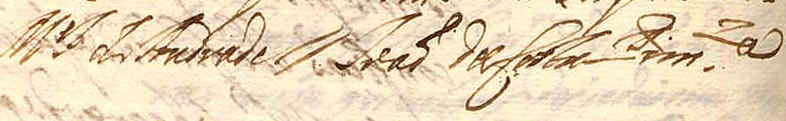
M.el de Andrade // Ioaõ da Costa Pim.ta
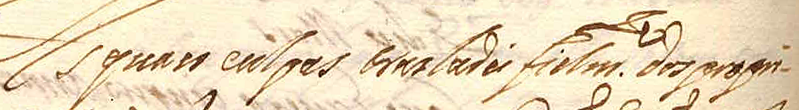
As quaes culpas trasladei fielm.te dos propri
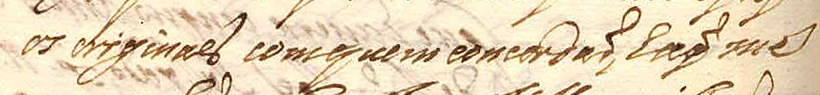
os originaes com quem concordaõ, E a q̄ me
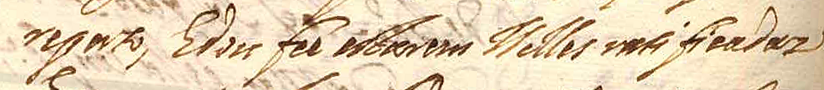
reporto, E dou fee estarem Nelles ratificadaz
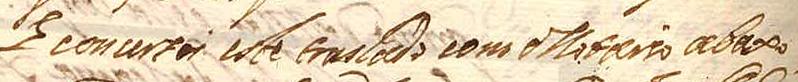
E concertei este traslado com o Notario abaxo
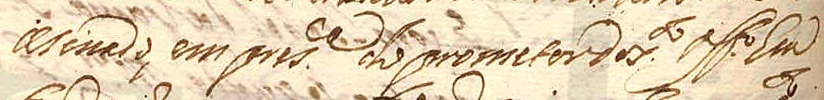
asinado, em pres.ça do prometor do s.to off.o Em
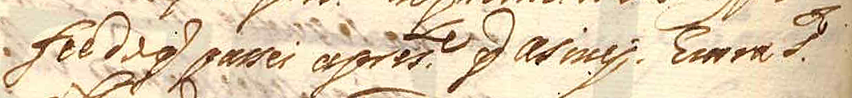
fee do q̄ passei a pres.te q̄ asinej. Euora s.to
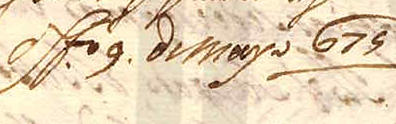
off.o 9 de Mayo 675
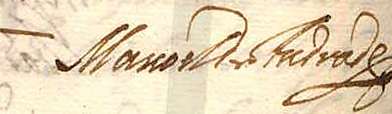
Manoel de Andrade
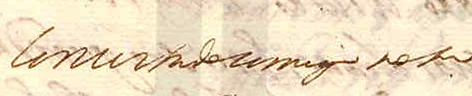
concertado comigo not.ro
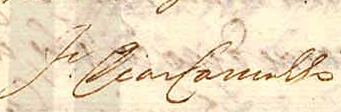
J.o Dias Carualho
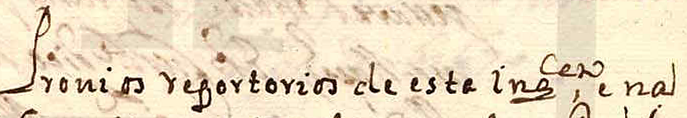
Proui os reportorios de esta inq.çam e nā
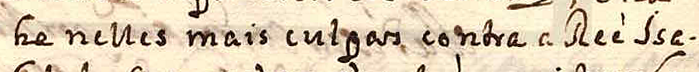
ha nelles mais culpas contra a Reé Isa
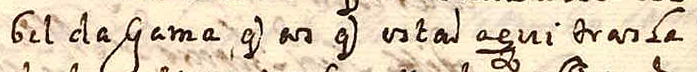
bel da Gama, q̄ as q̄ estaõ aqui trasla
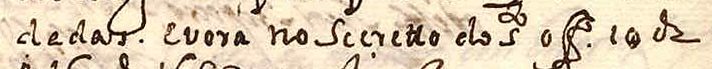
dadas. Evora no Secretto do sto off.o 10 de
